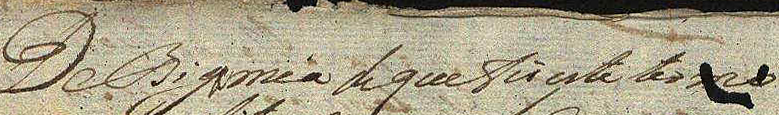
De Bigamia de que fis este termo
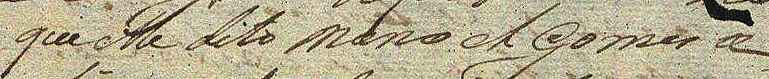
que elle dito manoel Gomes a
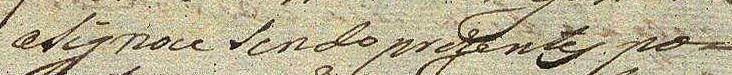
asignou sendo prezentes por
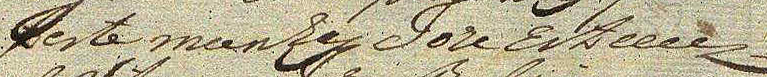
Testemunhas Ioze Esteues
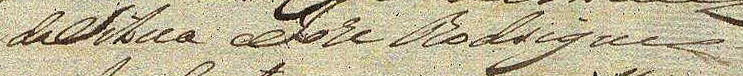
da Silua Ioze Rodrigues
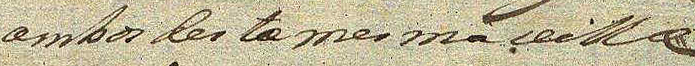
ambos desta mesma uilla
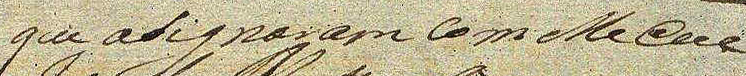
que asignaram com elle e eu
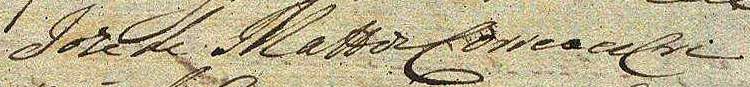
Ioze de Mattoz Correa esCri
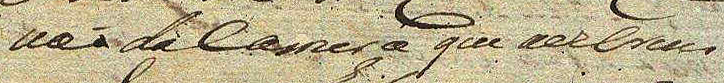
uaõ da Camera que o escreui
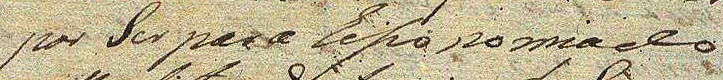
por ser para hisso nomiado
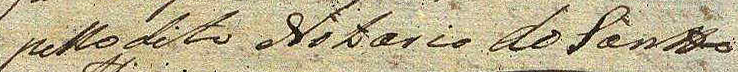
pello dito Notario do Santto
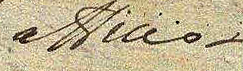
officio
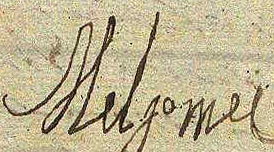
Mel gomes
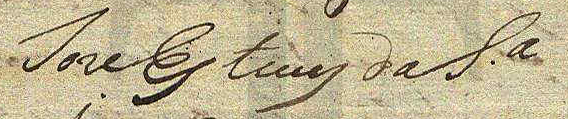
Ioze Esteues da S.a
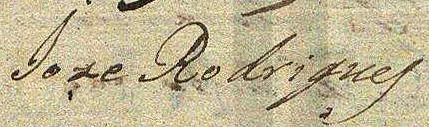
Ioze Rodrigues
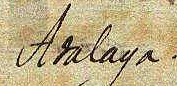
Atalaya.
